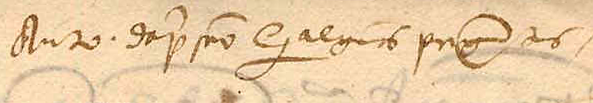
Auto. da p̄são e alguas pergūtas
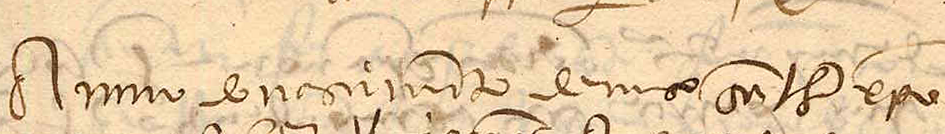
Annno do nasimēto de noso s̄or Jho x̄po
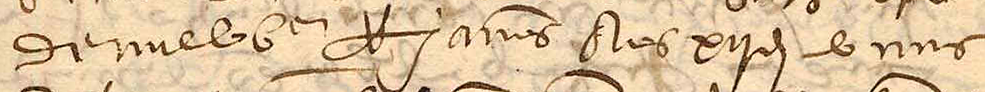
de mll bc Rj an̄os Aos xij ds do mes
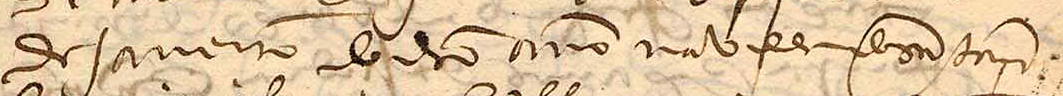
de Janeiro do dto an̄o na villa de sātarē
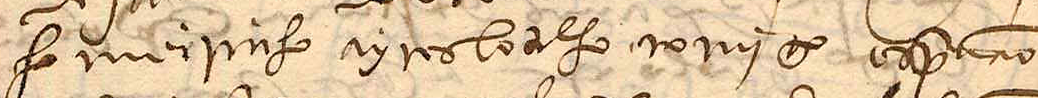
ho meirinho ayres botelho comjgo esp̄uão
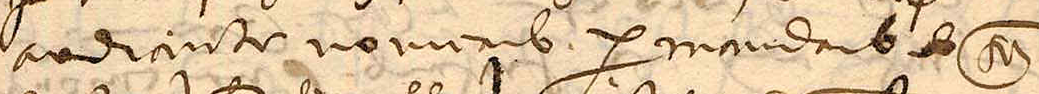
ao diante nomeado ꝑ mandado do s̄or
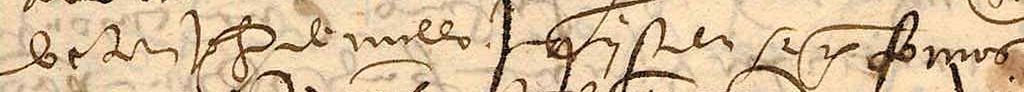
doctor Johā de mello Jnqjsidor e p̄ fomos
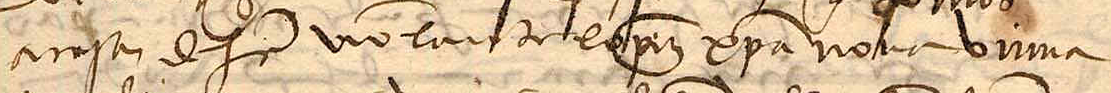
a casa de hūa violante lop̄iz xp̄a noua viuua
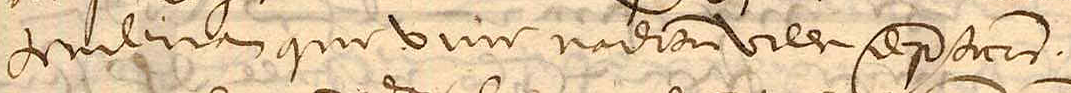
tendeira que viue na dit̄a villa de sātarē.
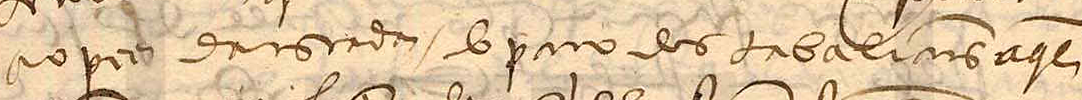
ao pee da estrada / do paço dos tabaliāes a q̄l
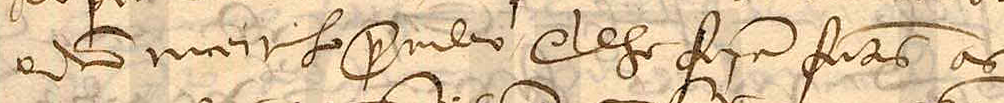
o dt̄o meirinho p̄ndeo e lhe forā feit̄as as
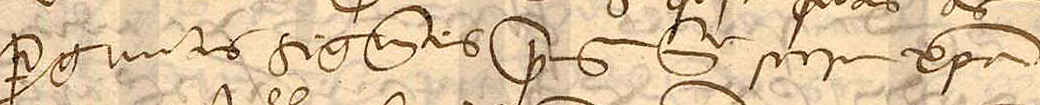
p̄guntas seguītes p̄gūtou se era xp̄a
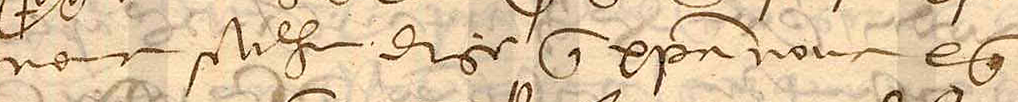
noua se velha dise q̄ xpā noua e q̄
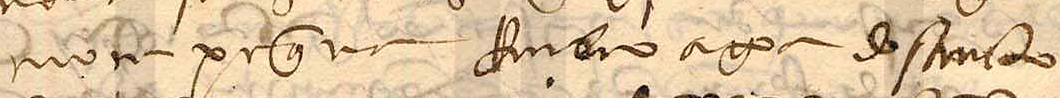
noua porq̄ ela Reçebeo agoa do sancto
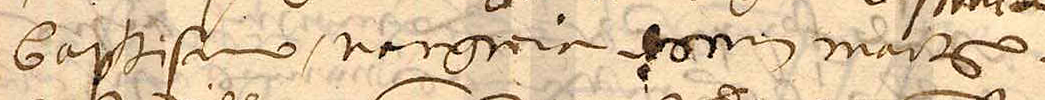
baptismo / na egreia de sam martō
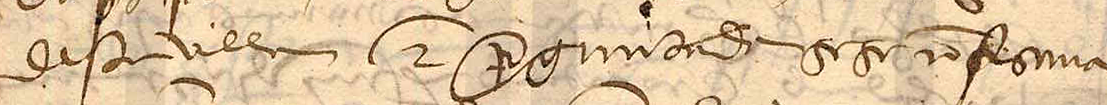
desta villa item p̄guntada se se c̄ofesaua
